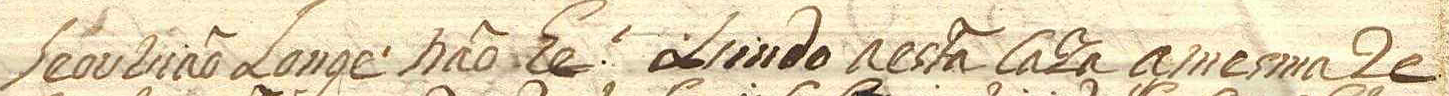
Se ouviaõ Longe naõ he: Vindo a esta caza a mesma re
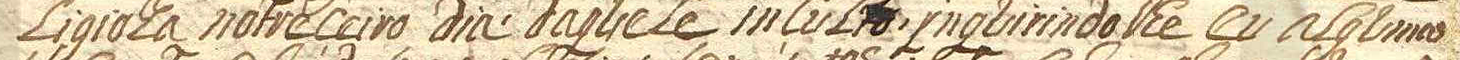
Ligioza no treceiro dia daquele inÇuLto ynquirindolhe eu algumas
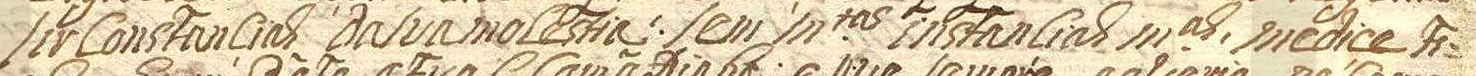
sirConstanCias da sua molestia: sem m.tas instanCias mas. me dice ti
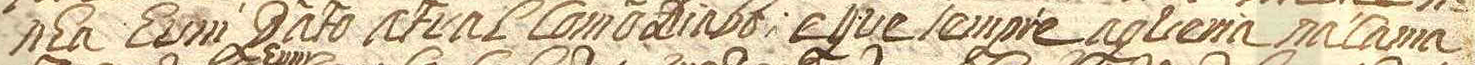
nha um pato atual com o Diabo; e que sempre a queria na Cama
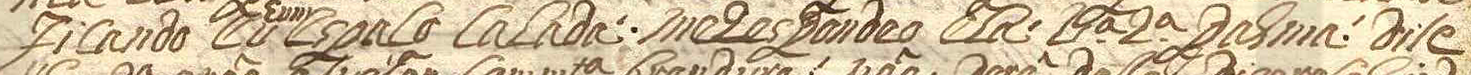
Ficando Eu hum EspaÇo Calada: me Respondeo ela. V.a 2.a Palma: dise
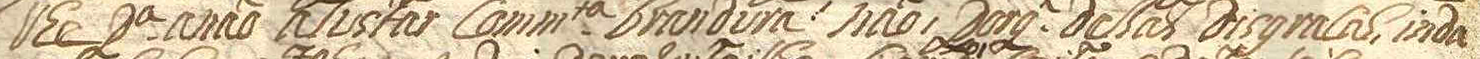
lhe p.a a não asustar com mt.a brandura: não, porq̄. dessas disgraças, inda
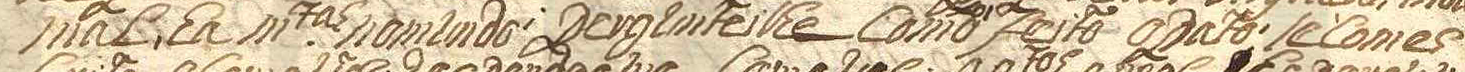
mal, ha m.tas no mundo; pergunteilhe como feito o pato se com es
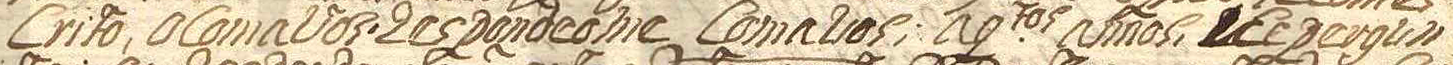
Crito, o com a voz. Respondeome Com a vos; a q.tos annos. lhe pergun
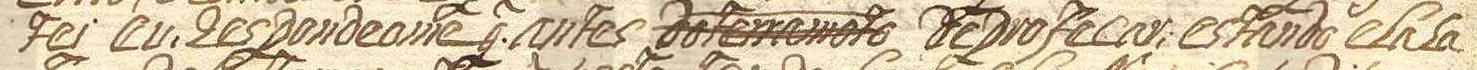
tei eu. Respondeome q̄. antes __ de profeçar; estando ela la
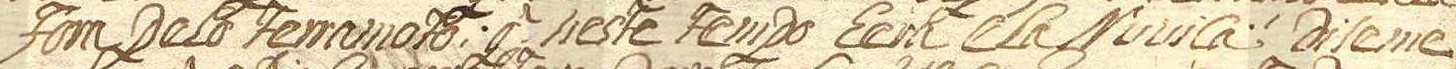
Fora pelo terramoto; q̄ neste tempo hera ela NuuiÇa; diseme
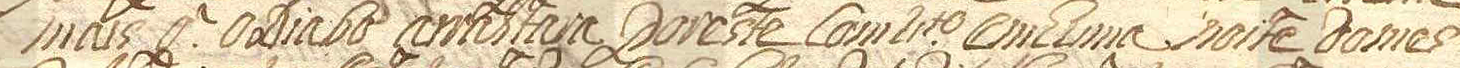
mais q̄ o Diabo arrastara por este Comvt.o em huma noite do mes
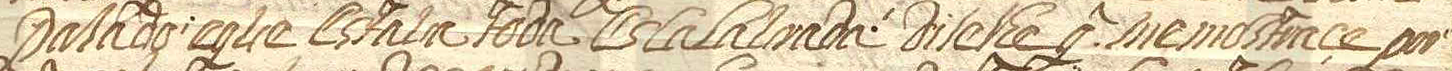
pasado; e que estava toda EsCalavrada. diselhe q̄ me mostrace por
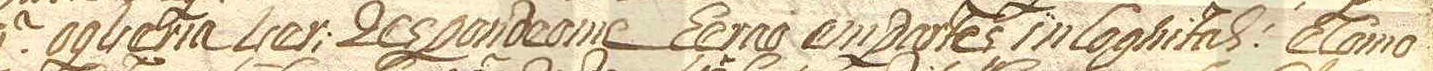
q̄ o queria uer: Respondeome heraõ em partes inCognitas: E Como
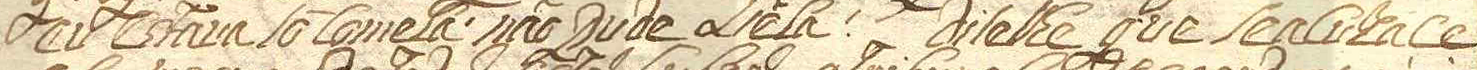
eu estaua só Com ela naõ pude vêLa; diselhe que se aCuzace
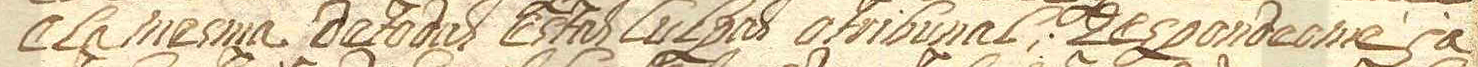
ela mesma de todas Estas Culpas o Tribunal, respondeome ja
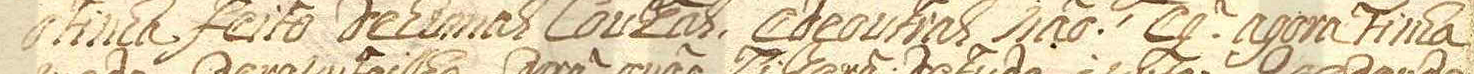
o tinha feito de humas Couzas, e de outras naõ: E q̄. agora tinha
